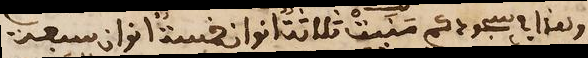وهذا في سجودكم منيت ثلاثة انوان خمسة انوان سبعة
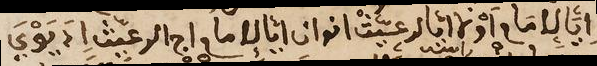ايالامام اولا ايالرعيث انوان ايالإمام اج الرعيث اديوي
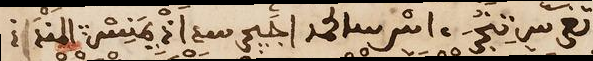تغرس تنجر ءاس سالحمد اجيجر سد اذ يمنس المندذ
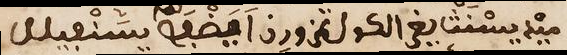انونسن ايموسنون انغ دمك اتسنث دزجن
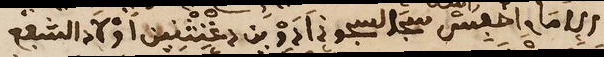الإمام اخفس سجالسجوذ ادوين دغنثنين اولا د الشفع
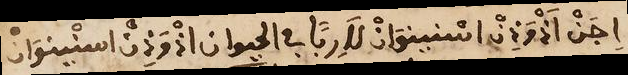اجن اذوذن اسنيوان لاربا في الحيوان اذوذن اسنينوان
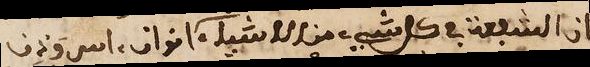ان الشفعة في كل شيء من الاشياء انوان ءاس وذن
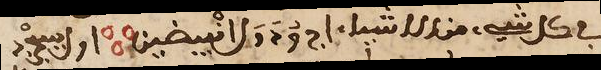في كل شيء من الاشياء اج ودول انيبضين اول يسجرد
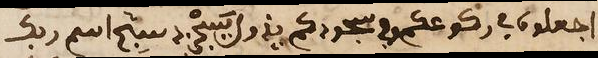اجعلوها في ركوعكم وسجودكم يذول يسجز د سبح اسم ربك
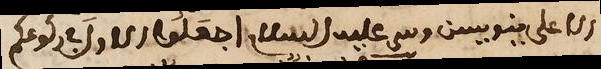الاعلى ينويسن وسر عليه السلام اجعلوا الاول في ركوعكم
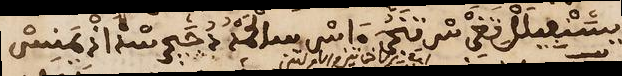يسنفيلل تغرس تنجره اس سالحمد دجيجر سداذ يمنس
